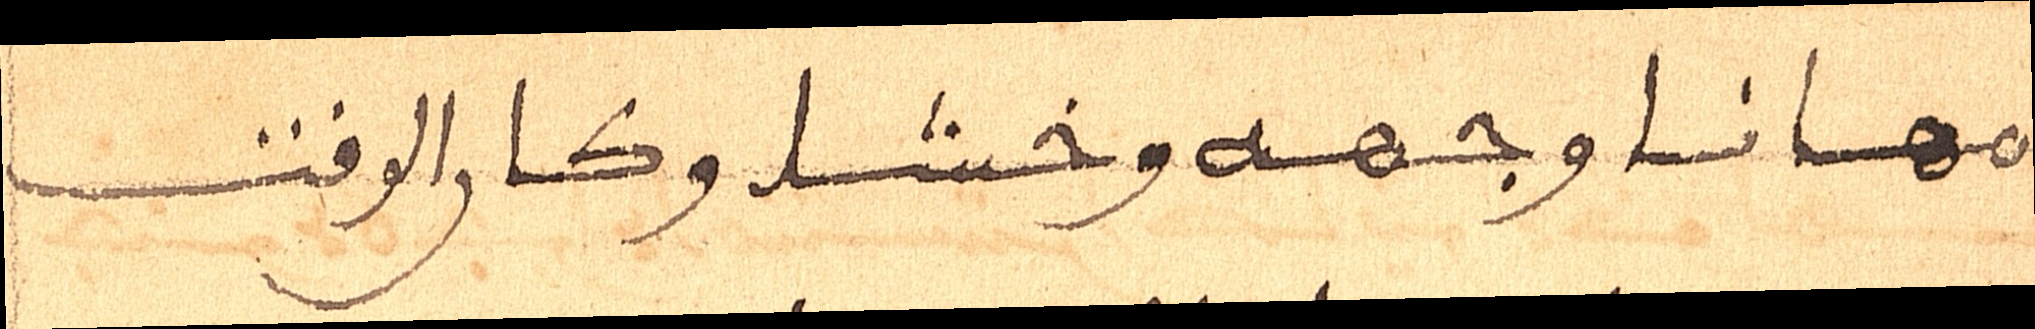مهانا وجهه وخشا وكان الوقت
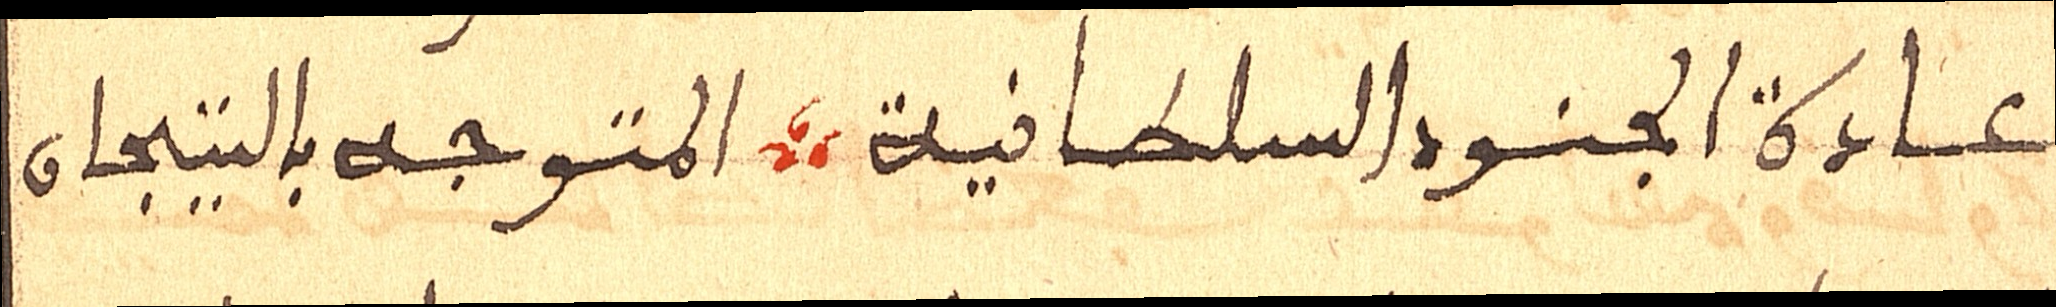عادة الجنود السلطانية المتوجه بالتيجان
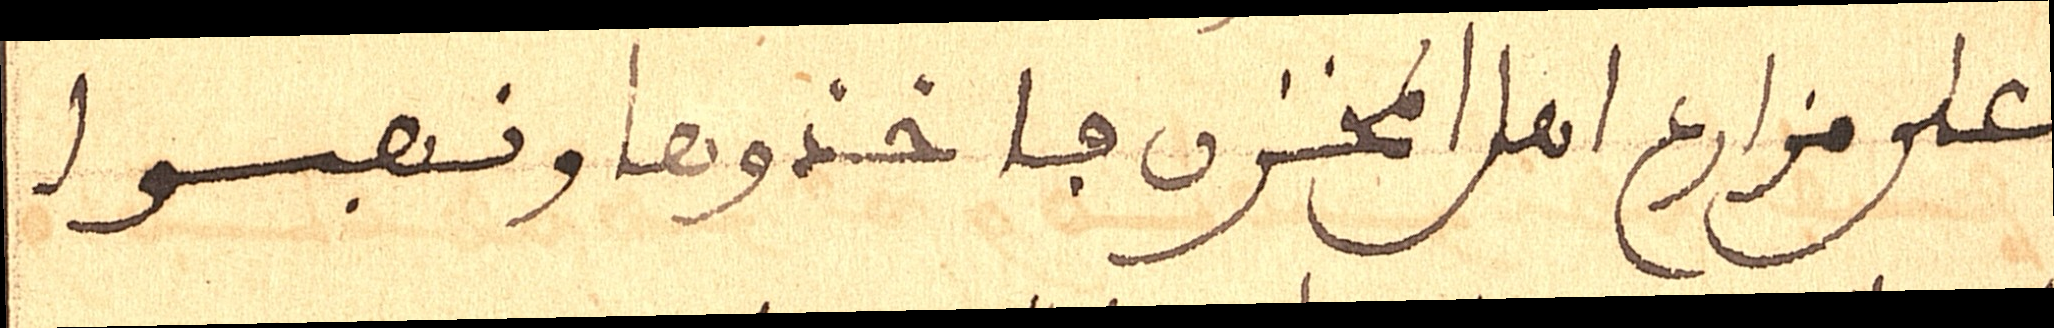على مزارع اهل المخزن فاخذوها ونهبوا
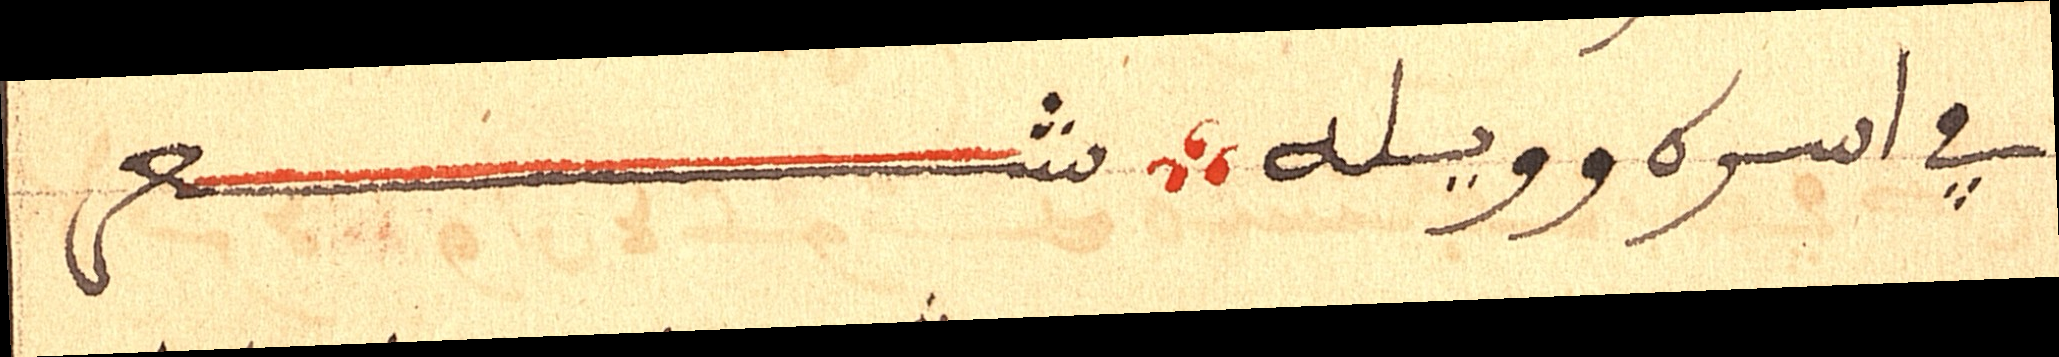في اسره و ويله شعر
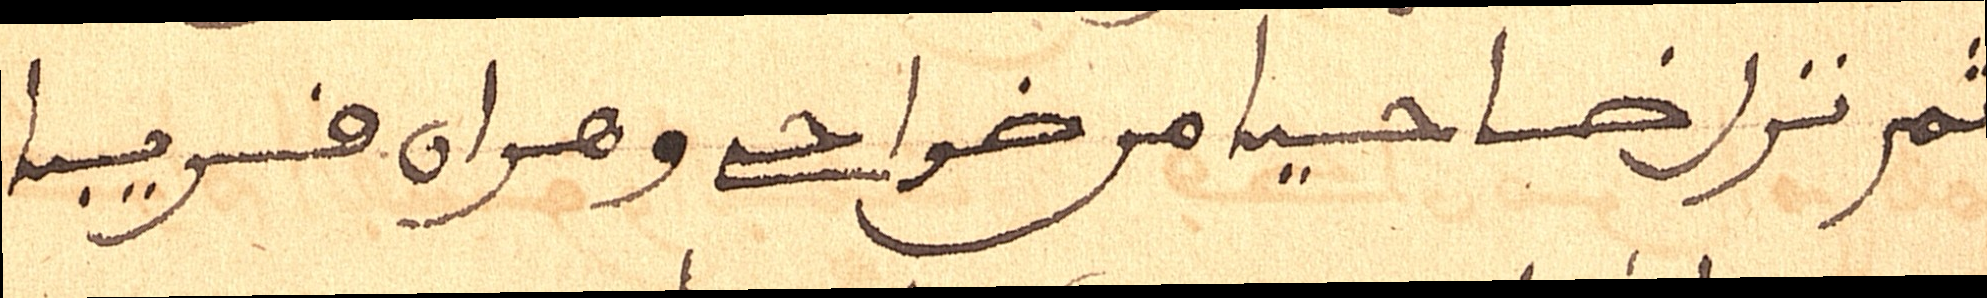ثم نزل ضاحيا من ضواحى وهران قريبا
